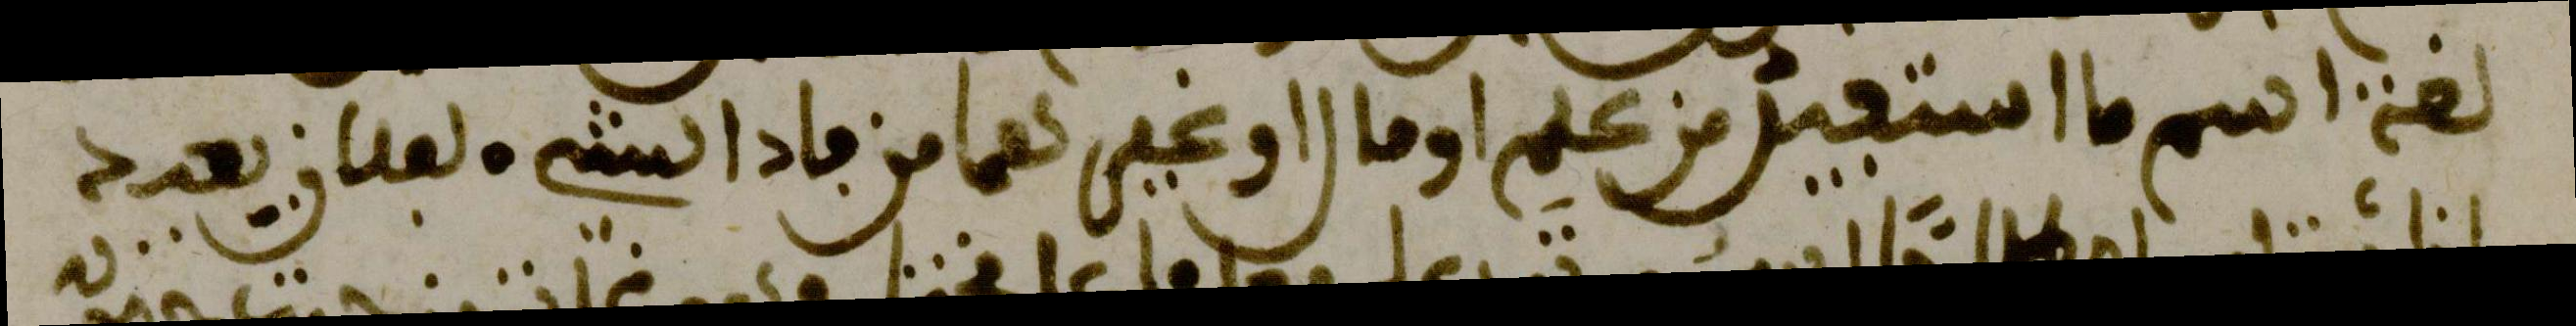لغة اسم ما استفيد من علم او مال او غيرهما من فاد الشيء لفلان يفيد
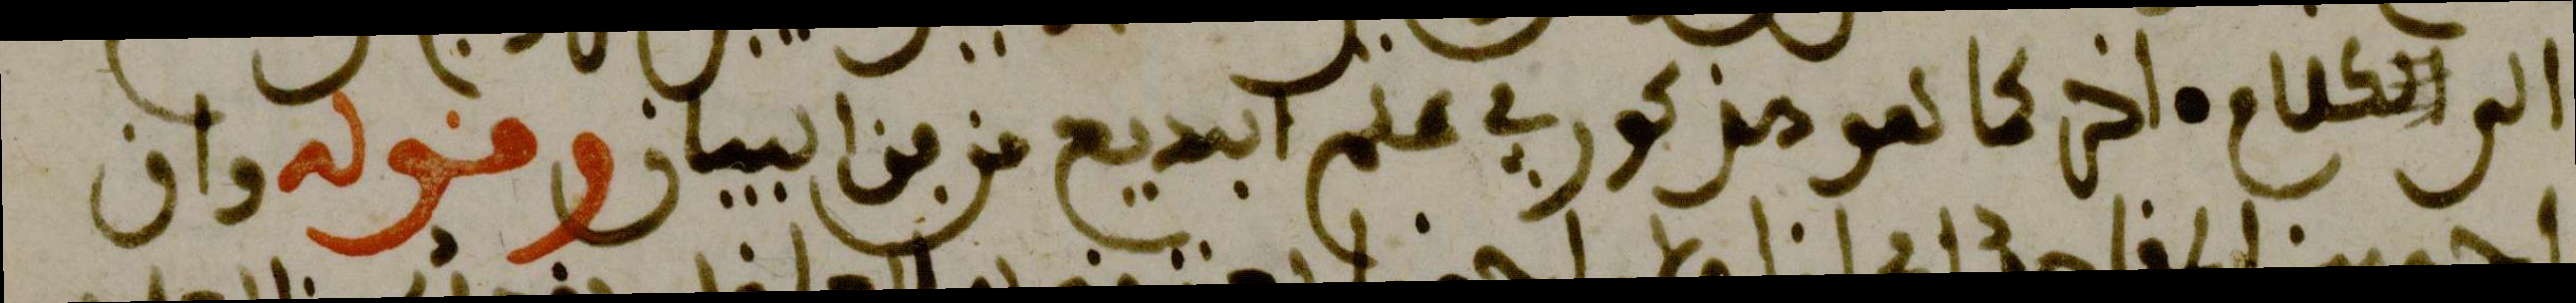الى الكلام ءاخر كما هو مذكور في علم البديع من فن البيان وقوله وان
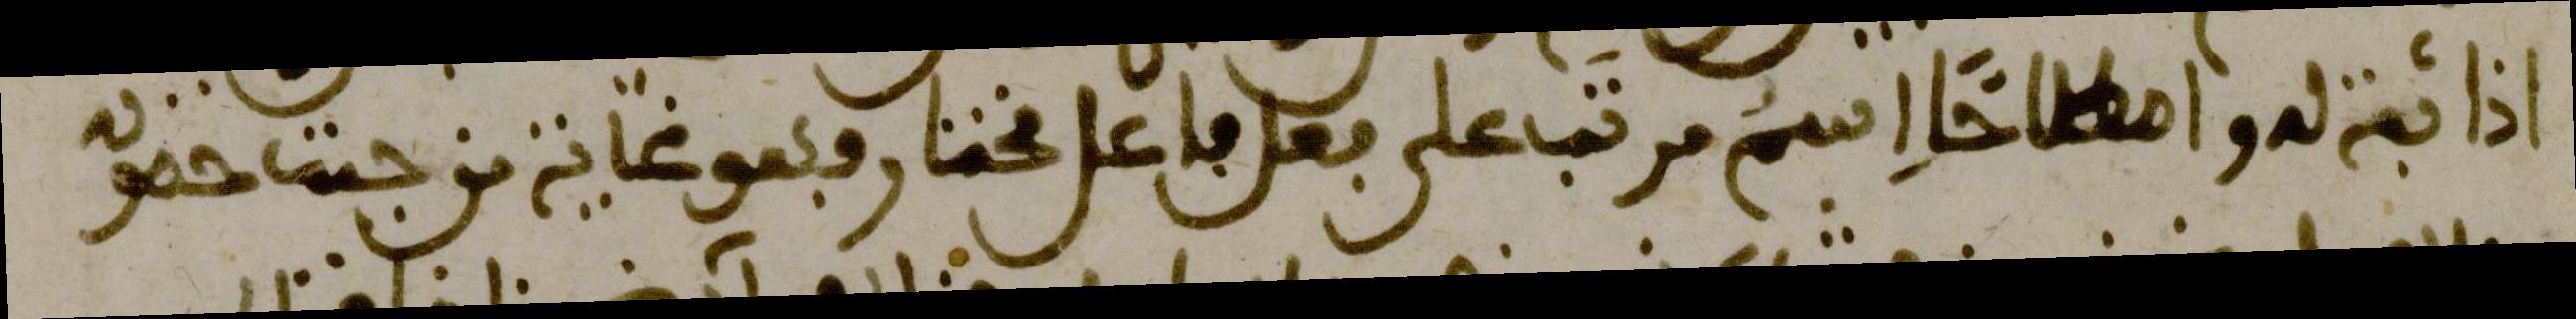اذا ثبة له واصطلاحًا اسم مرتَب على فعل فاعل مختار فهو غاية من حيث حصو
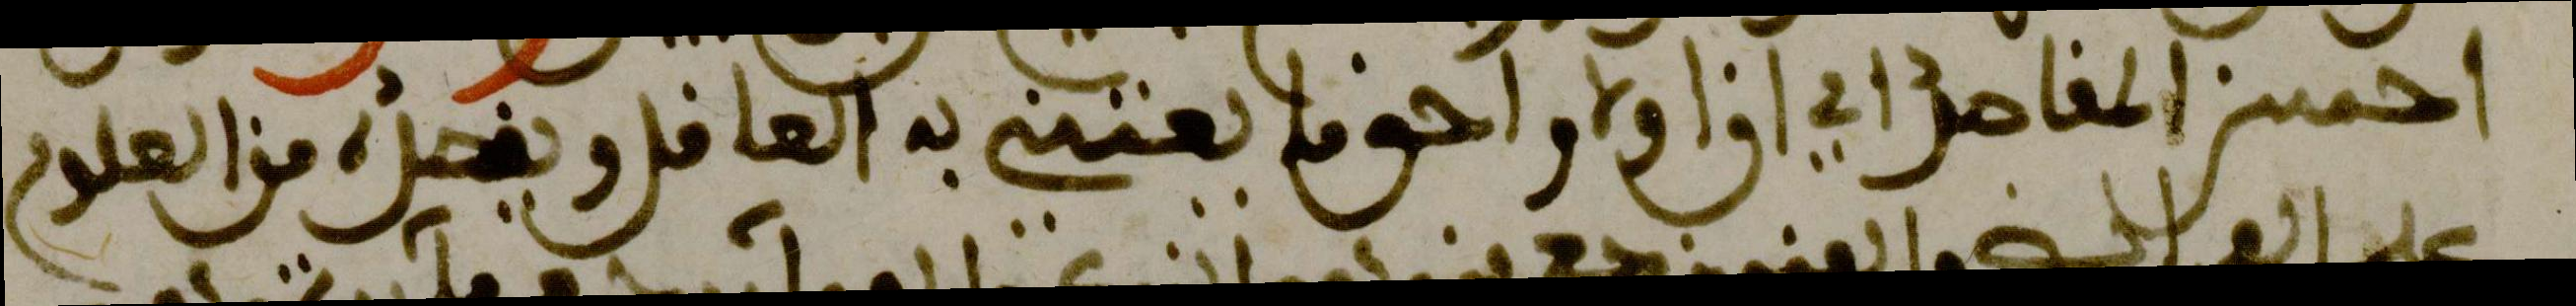احسن المقاصد اي ان اولا واحق ما يعتني به العاقل ويقصده من العلوم
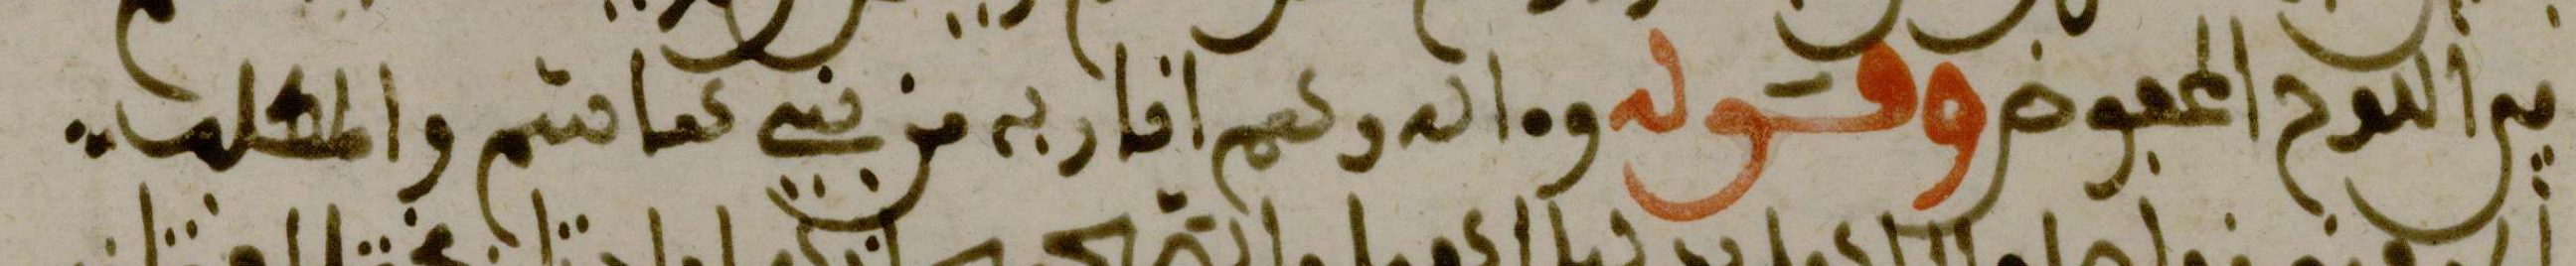في اللوح المحفوض وقوله وءاله وهم اقار به من يني هاشم والمطلب
